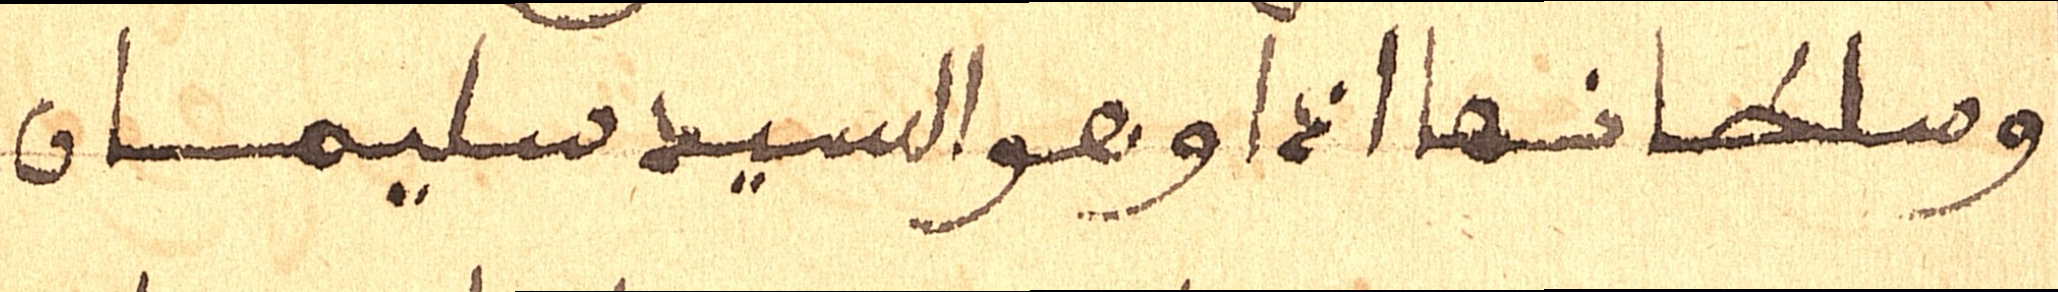وسلطانها اذا وهو السيد سليمان
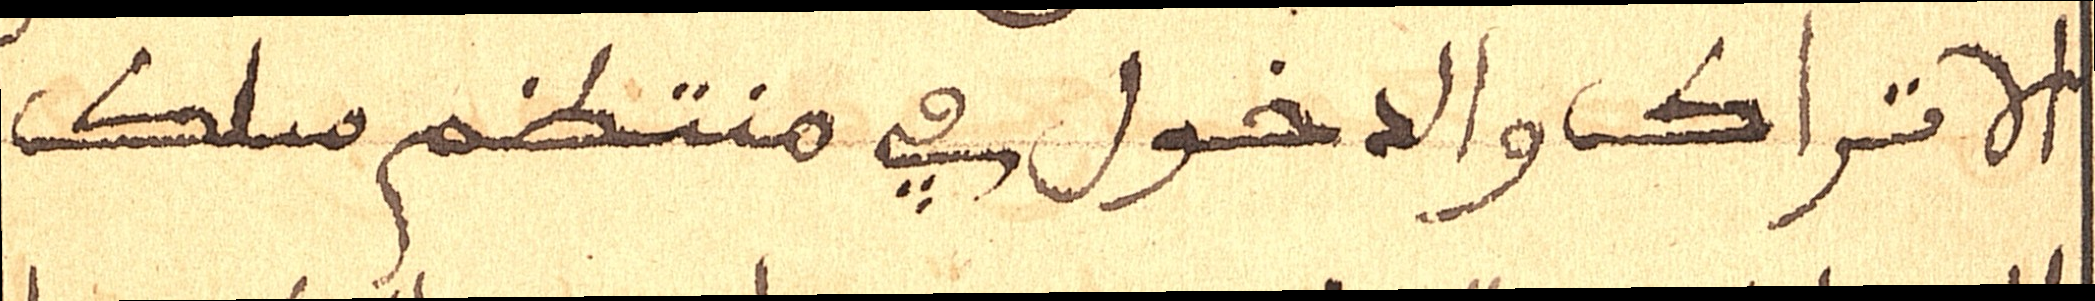الاتراك والدخول في منتظم سلك
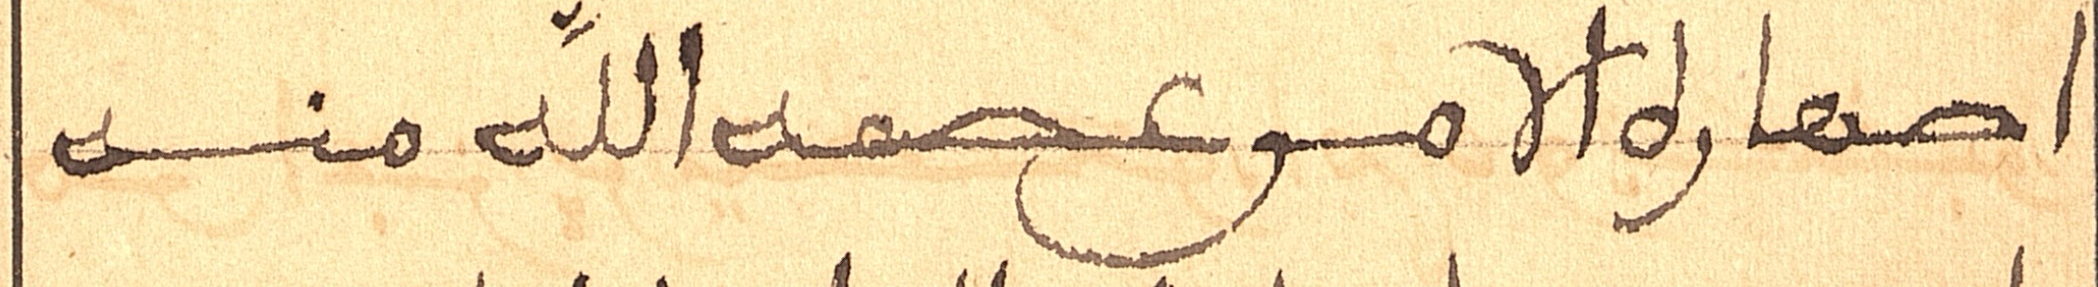اصهاره الامر عصمه الله منه
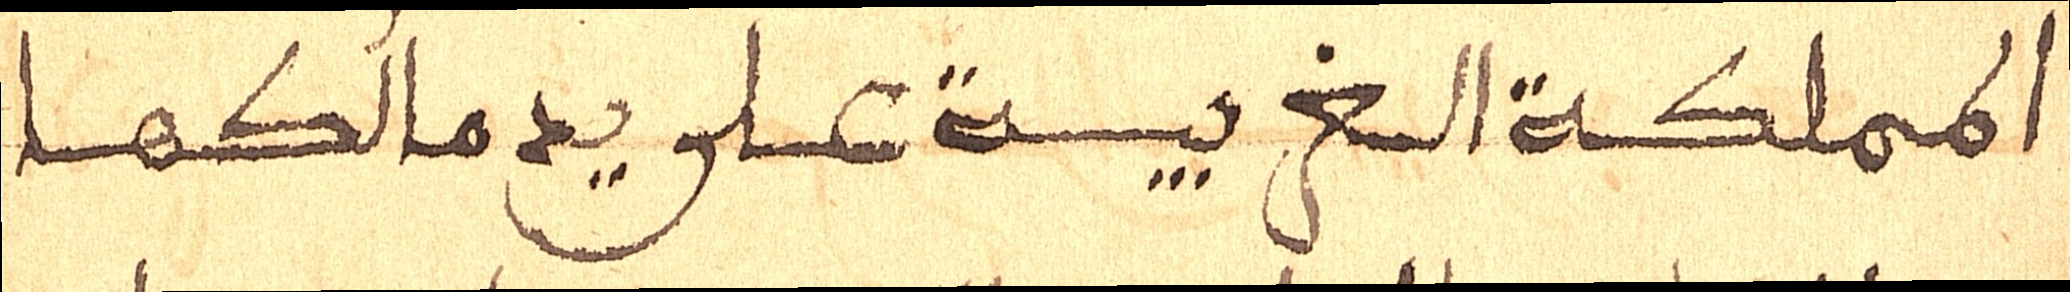المملكة الغربية على يد مالكها
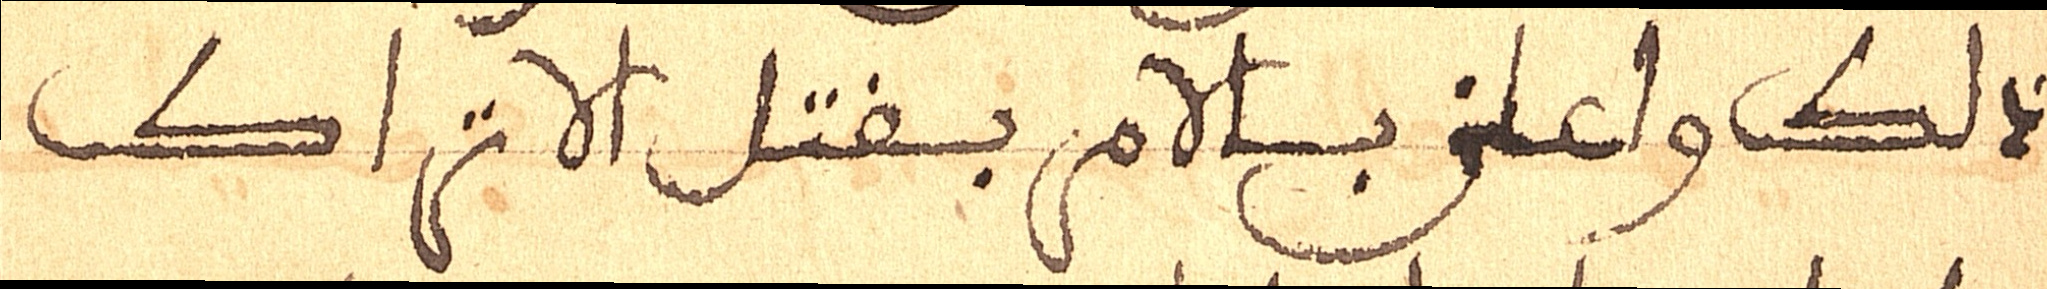ذلك واعلز بالامر بقتل الاتراك
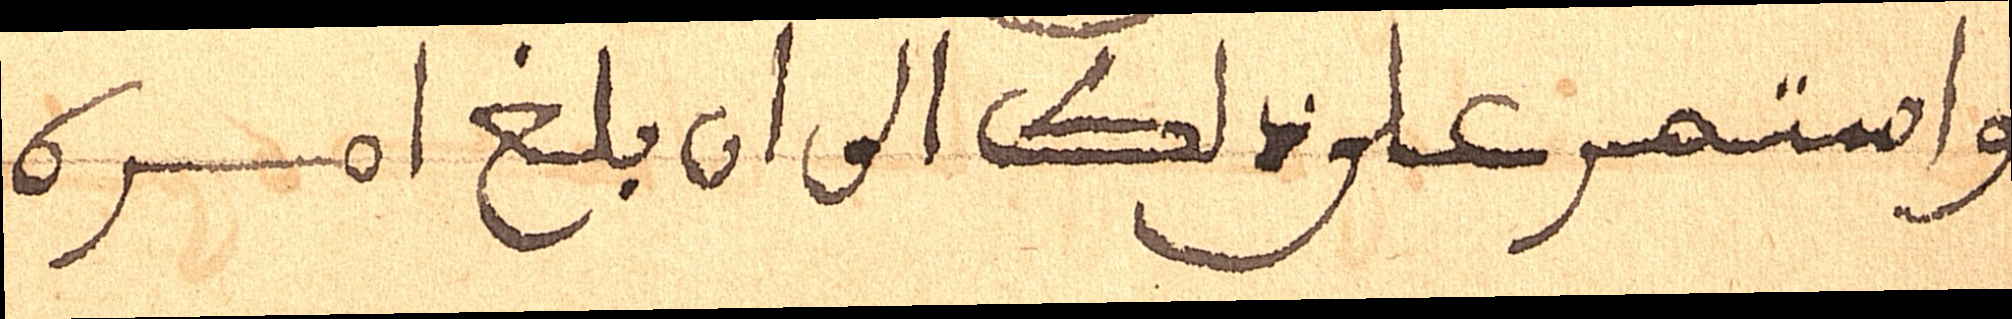واستمر على ذلك الى ان بلغ امره
